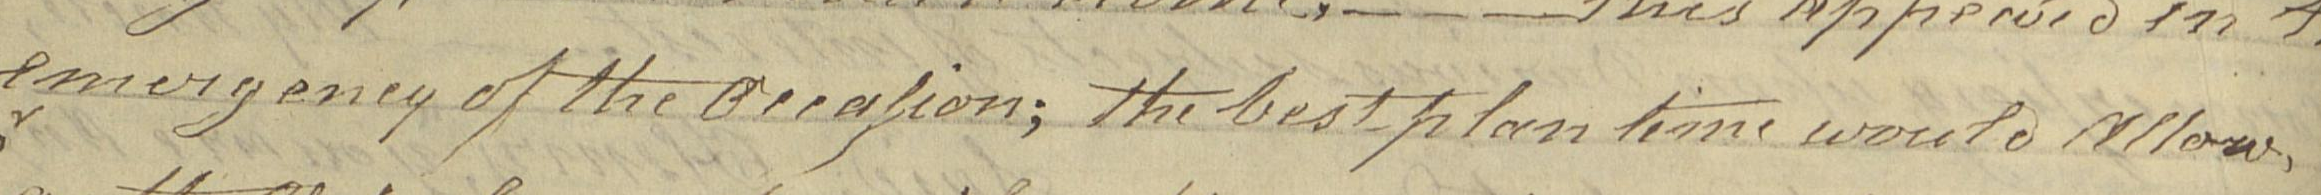emergency of the Occasion; the best plan time would allow.
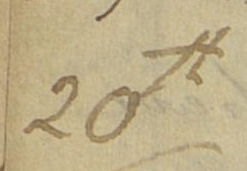20^th
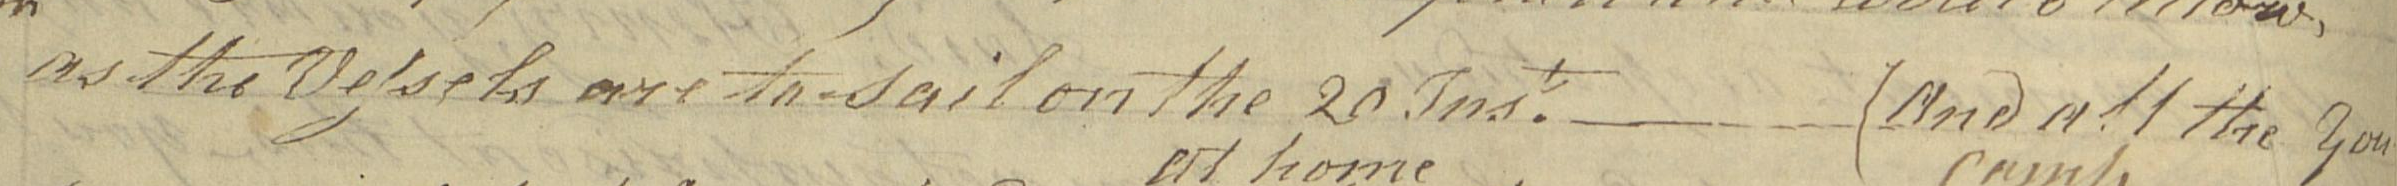as the Vessels are to sail on the 20 Ins^t. (And all the You-
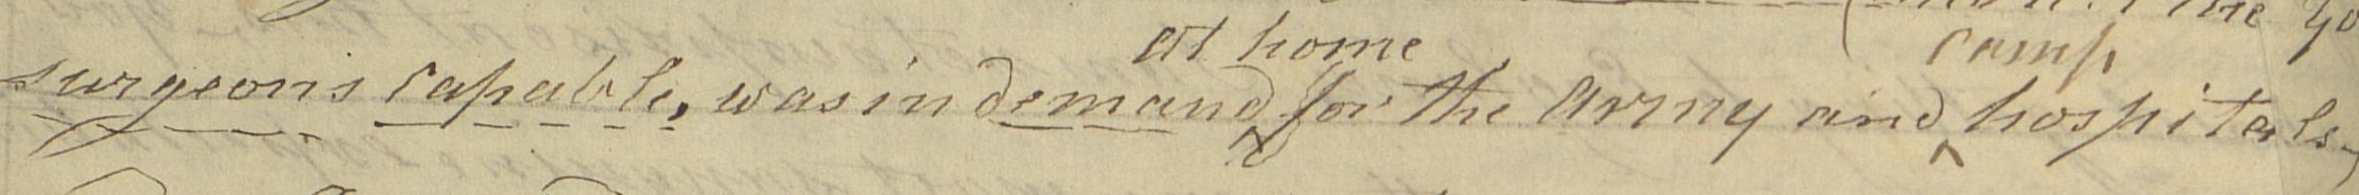surgeons Capable, was in demand ^ for the Army and ^ hospitals)
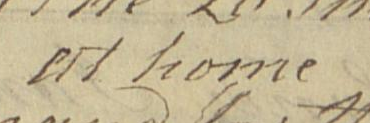At home
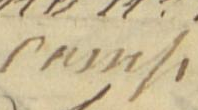camp
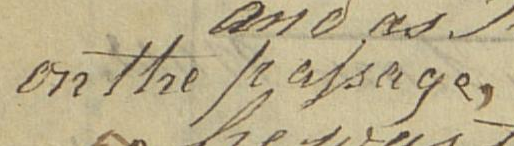on the passage,
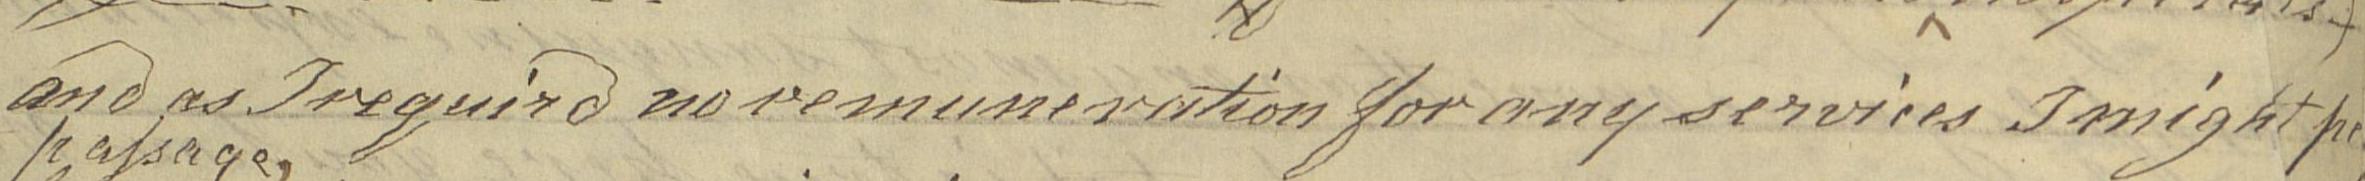and as I requird no renumeration for any services I might p-
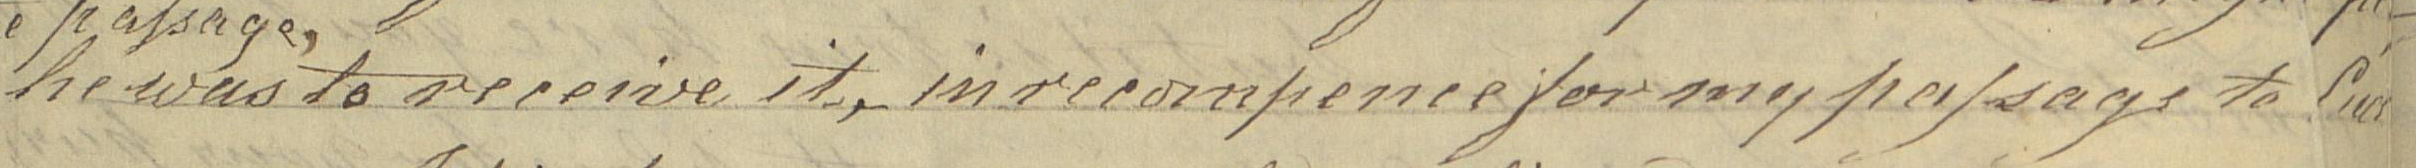he was to receive it, in recompence for my passage to Cur-
